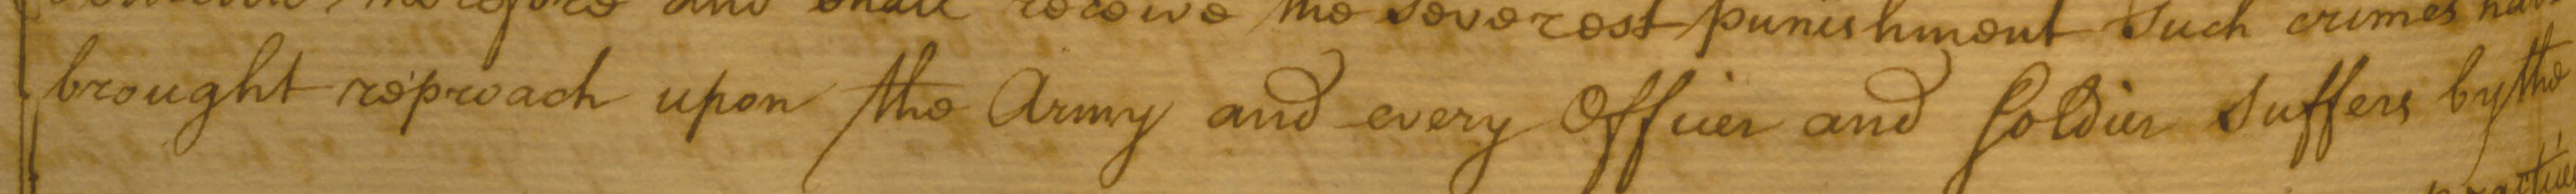brought reproach upon the Army and every Office and Soldier suffers by the
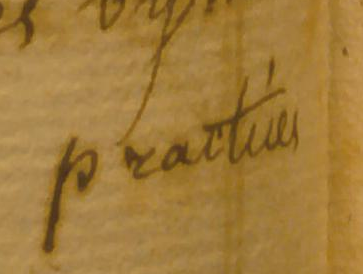practices
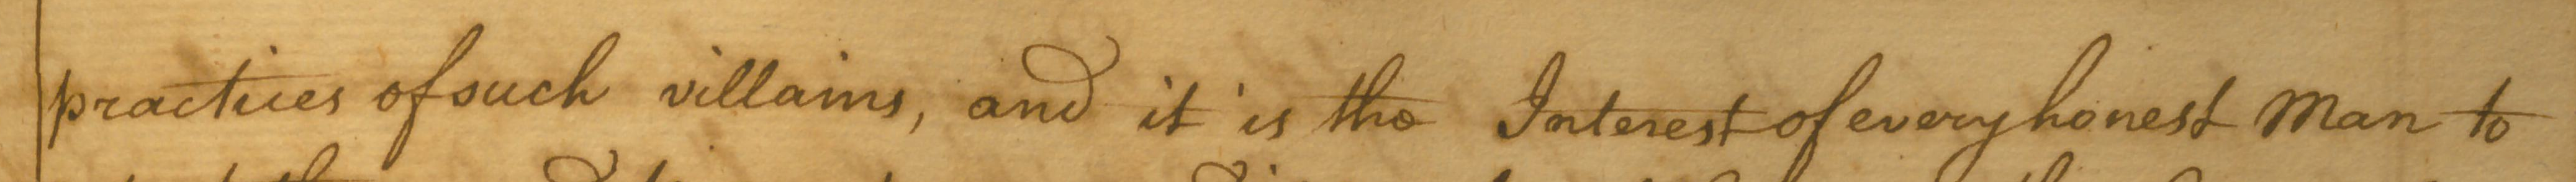practices of such villains, and it is the Interest of every honest Man to
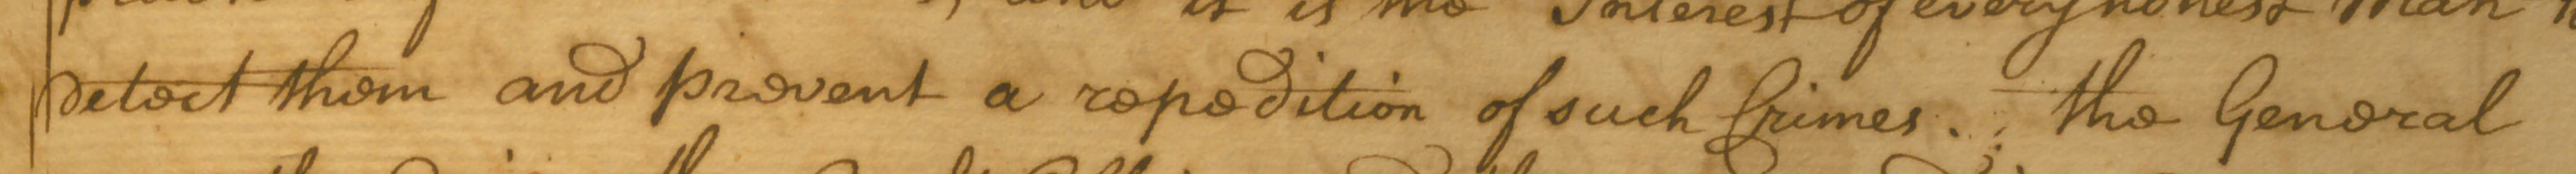detect them and prevent a repedition of such Crimes. the General
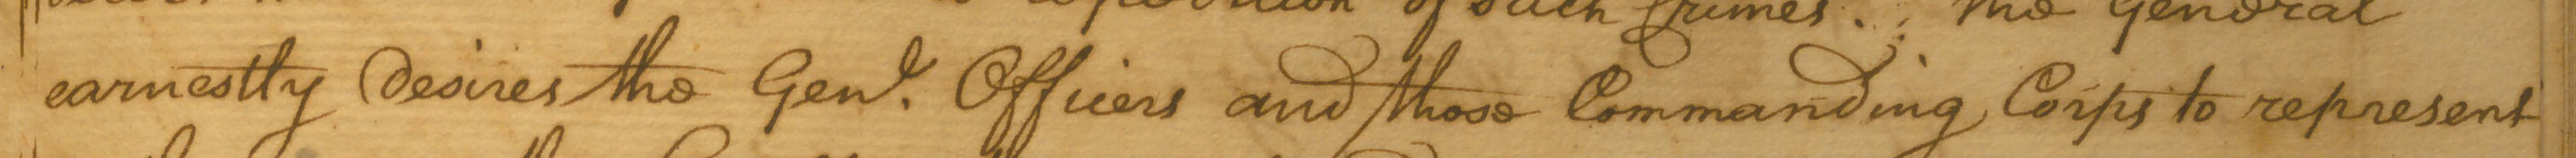earnestly desires the Gen^l. Officers and those Commanding Corps to represent
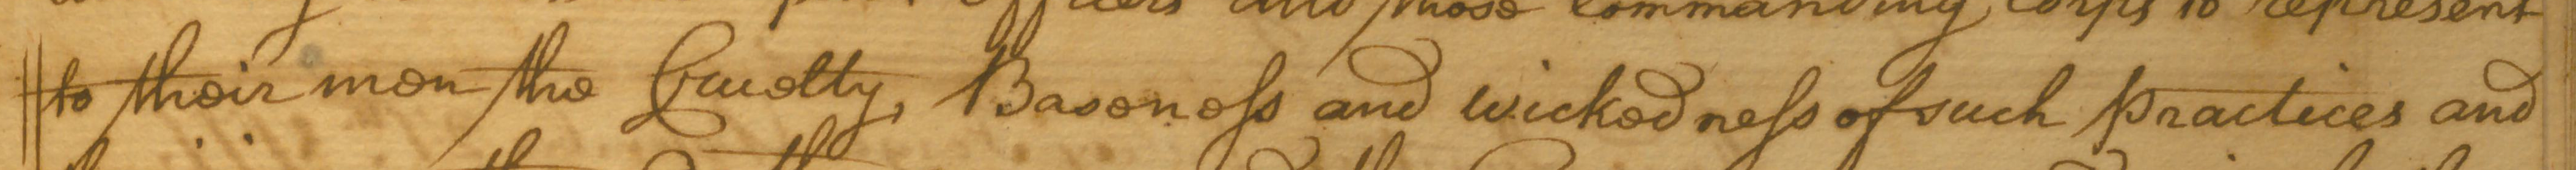to their men the Cruelty, Baseness and wickedness of such practices and
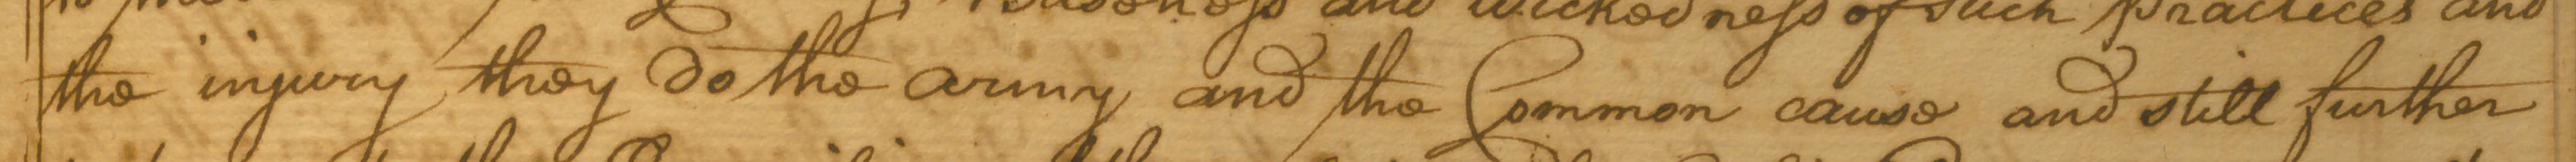the injury they do the army and the Common cause and still further
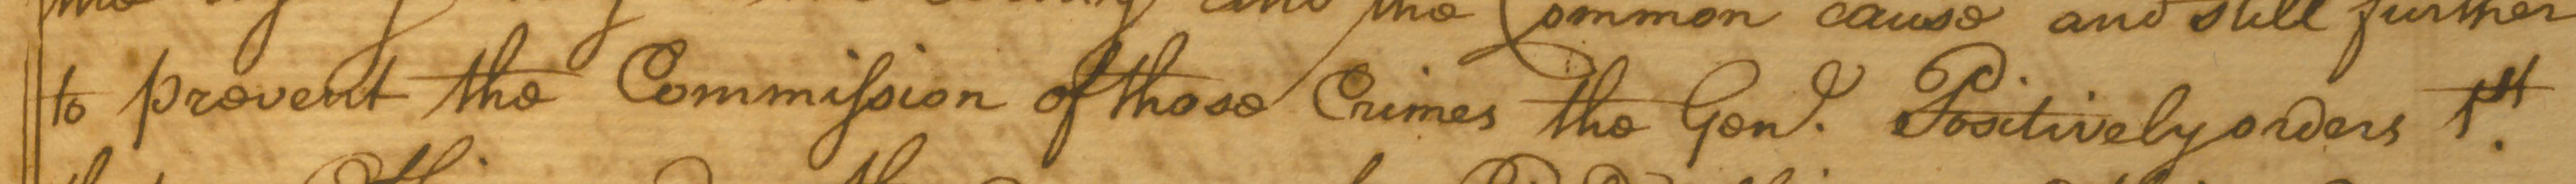to prevent the Commission of those Crimes the Gen^l. Positively orders 1^st.
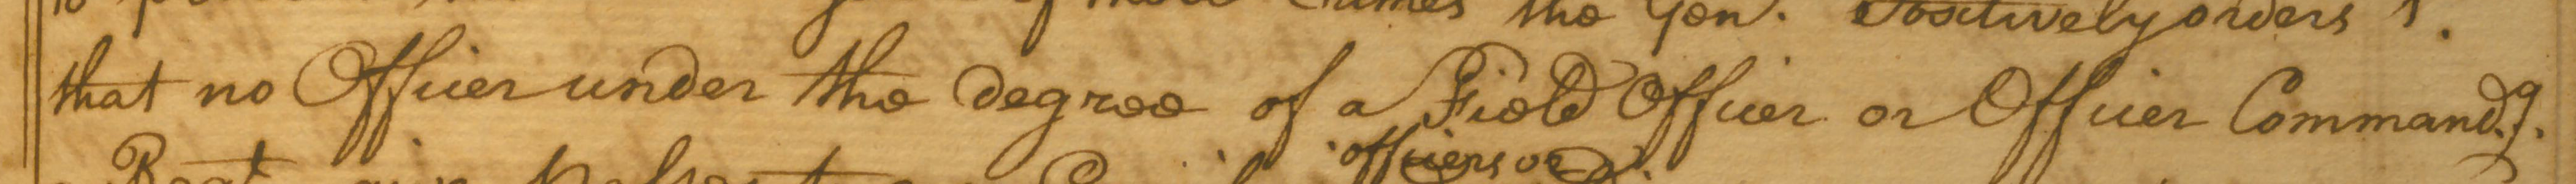that no Officer under the degree of a Field Officer or Officer Command^g.
